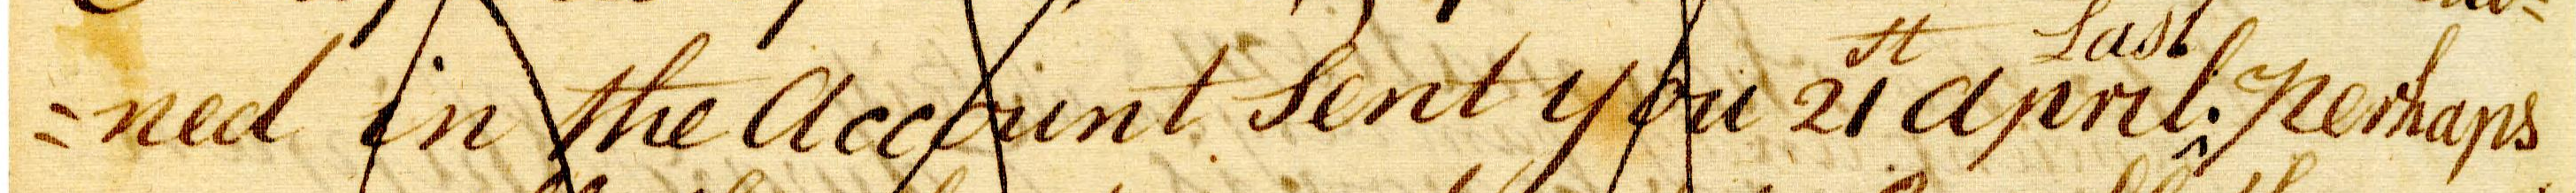-ned in the Account sent You 21^st April; perhaps
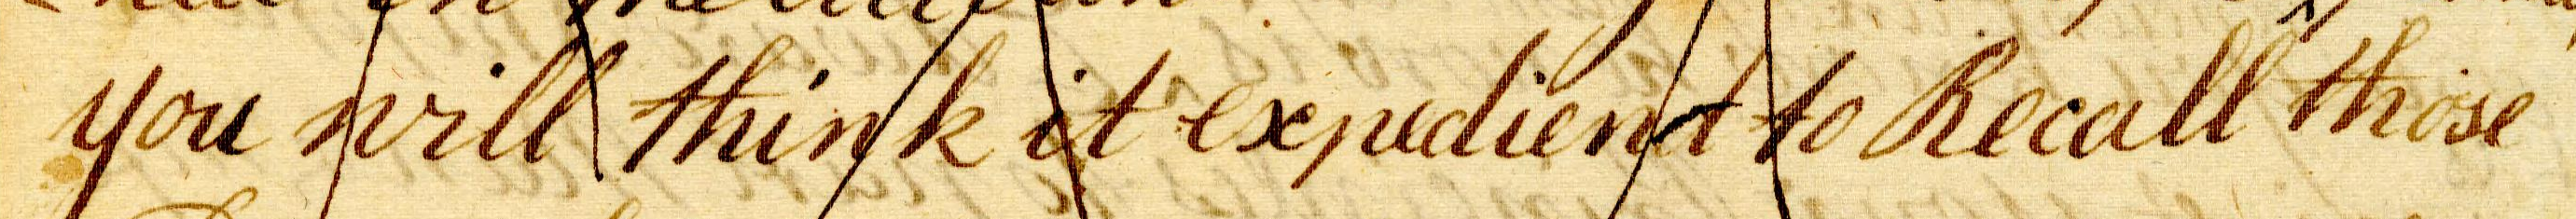You will think it Expedient to Recall those
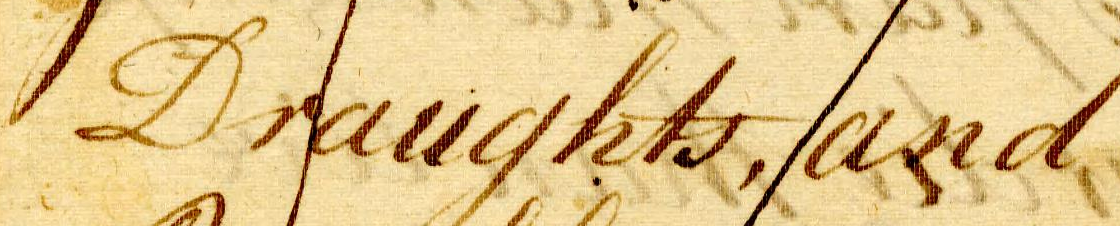Draughts, and
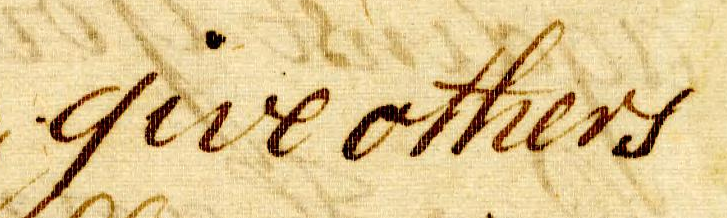give others
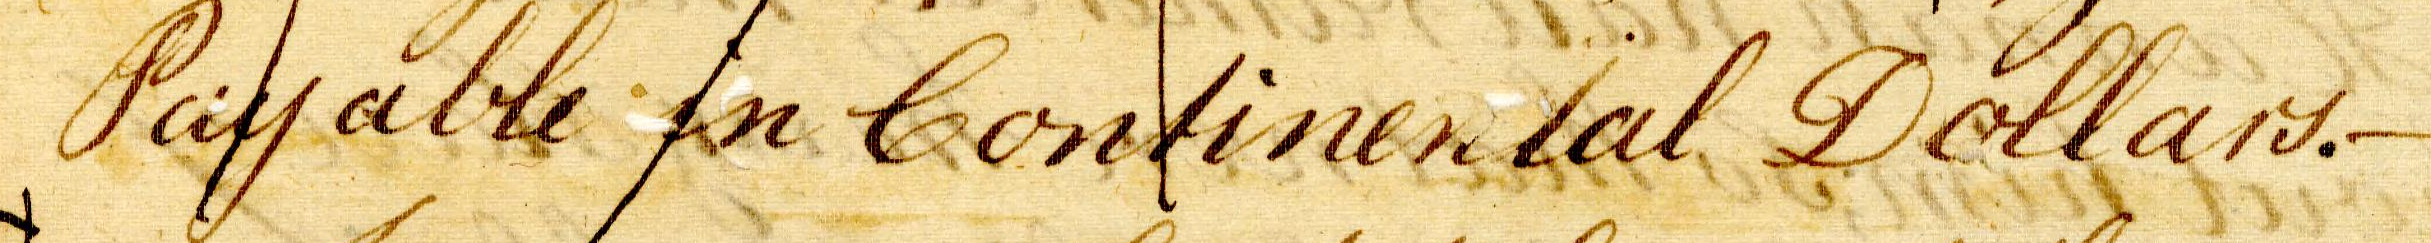Payable in Continental Dollars.-
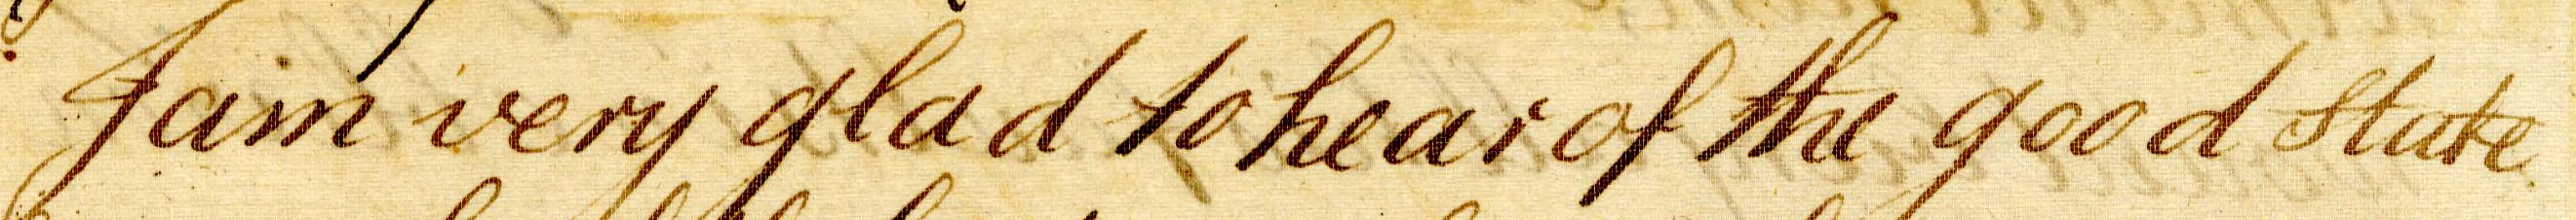I am very glad to hear of the good State
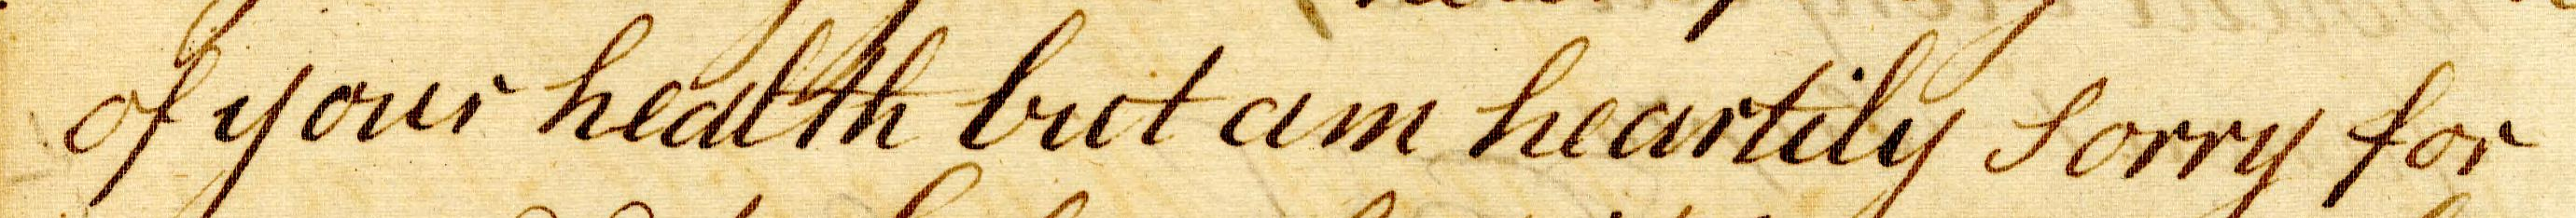of your health but am heartily Sorry for
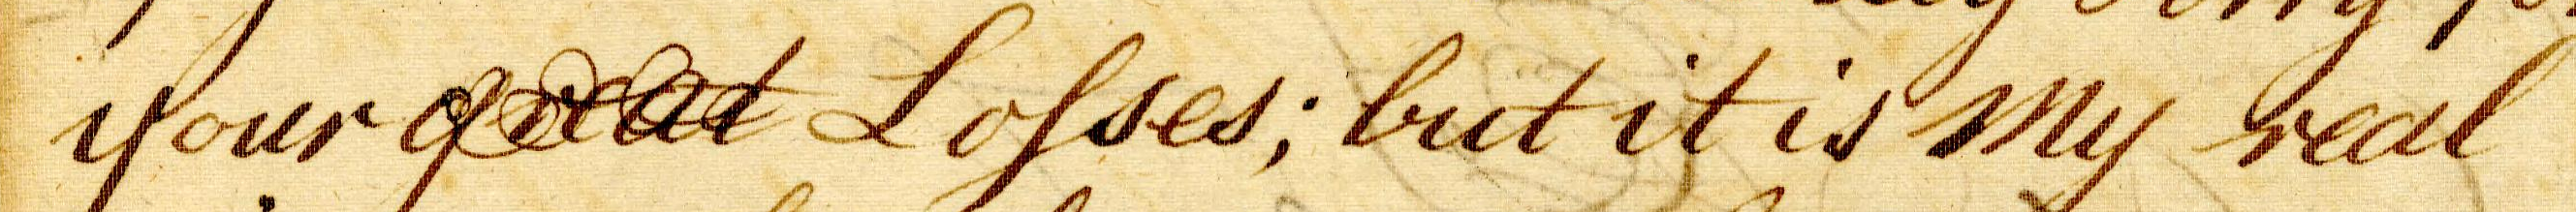your [great] Losses; but it is My real
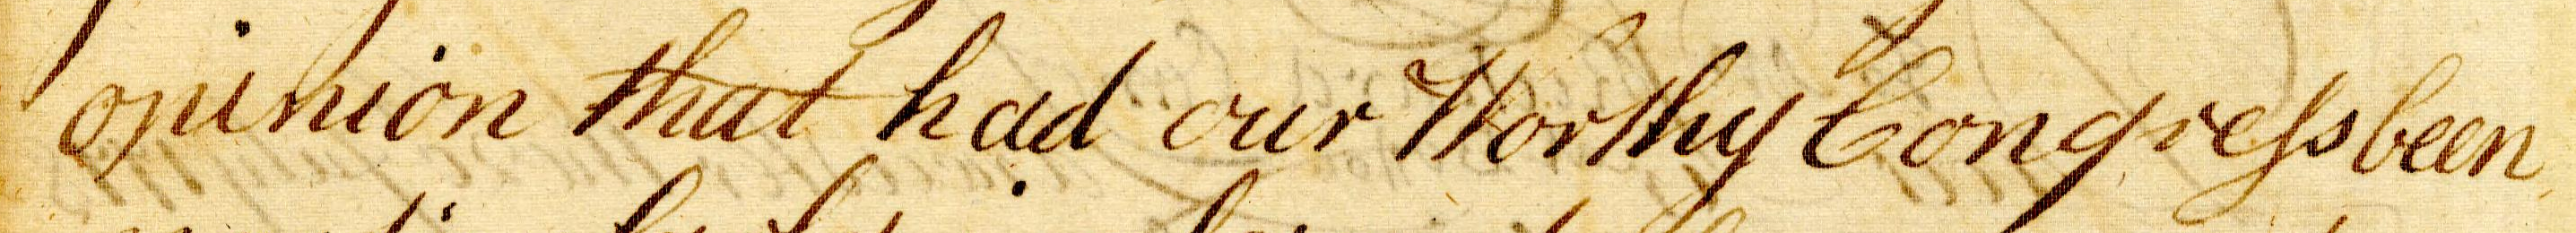opinion that had our Worthy Congress been
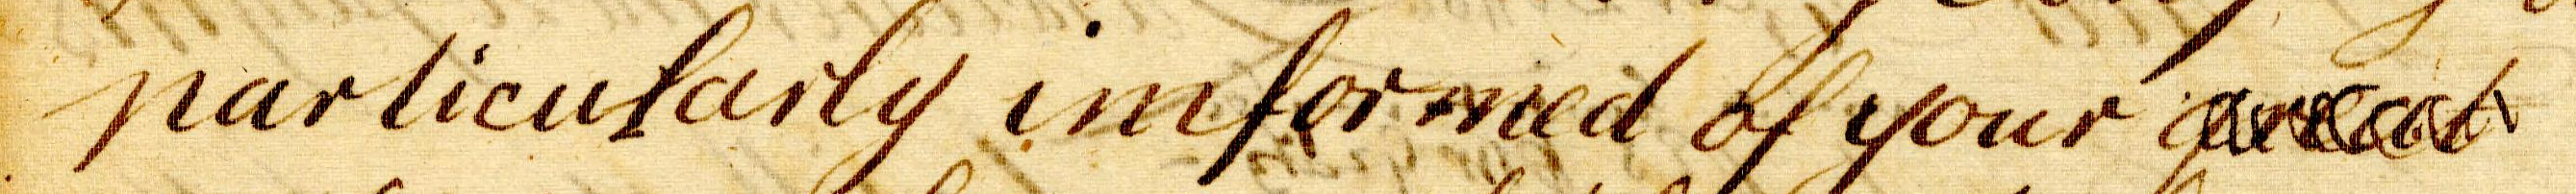particularly informed of your [great]
